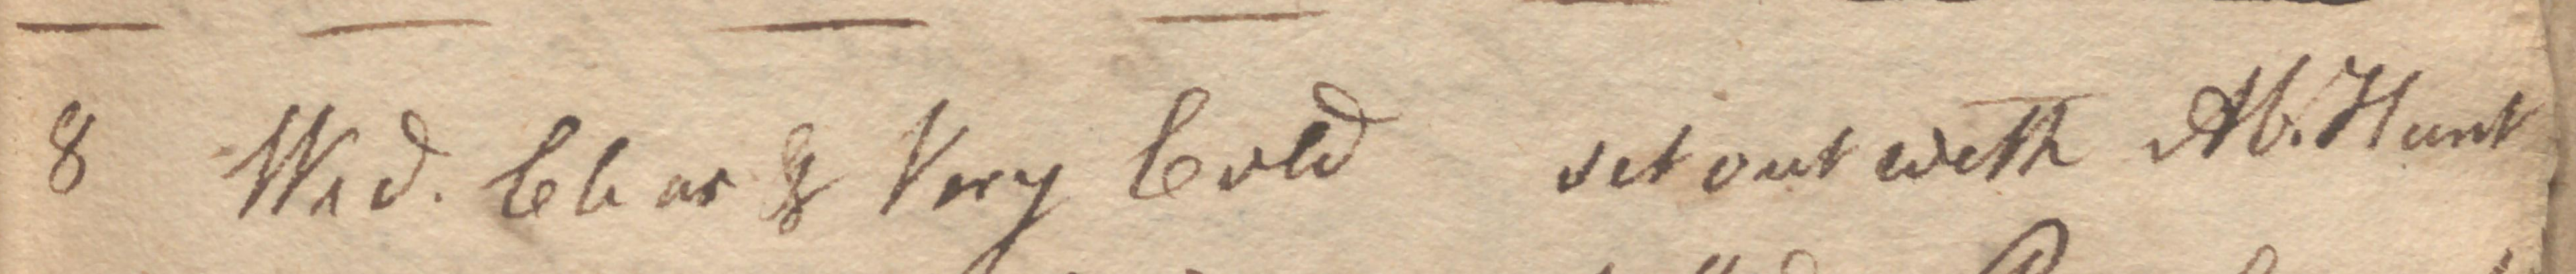8 Wed. Clear & Very Cold set out with Ab. Hunt
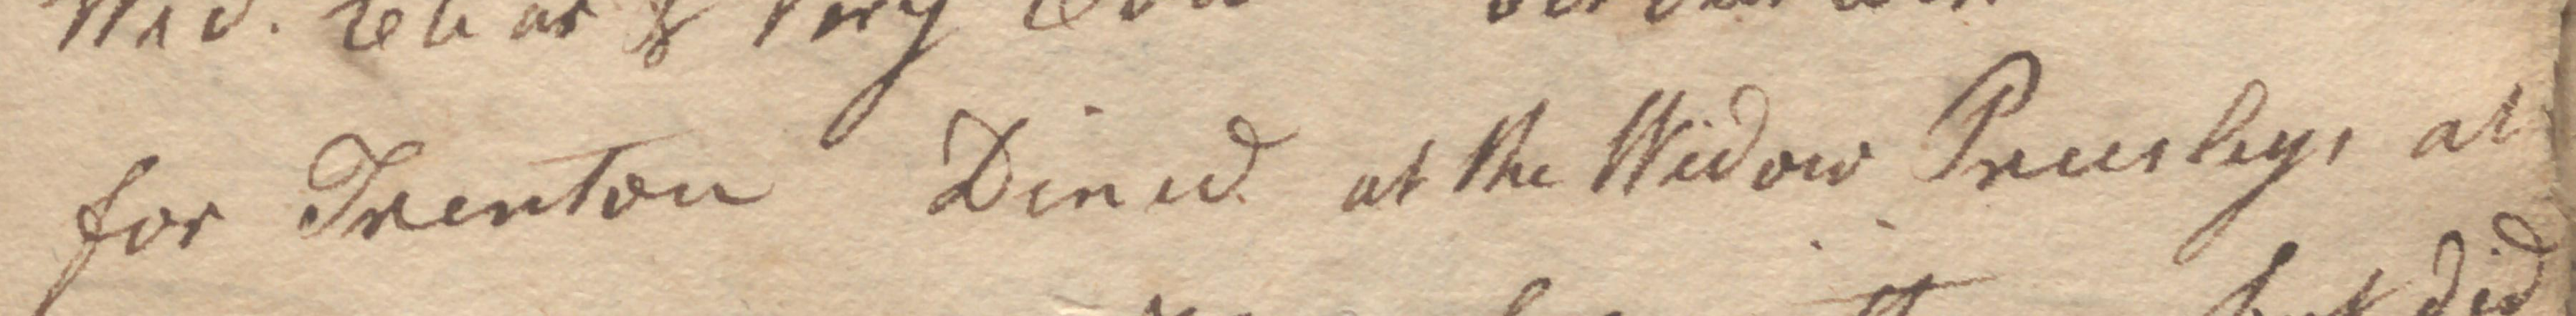for Trenton Dined at the Widow Preesleys at
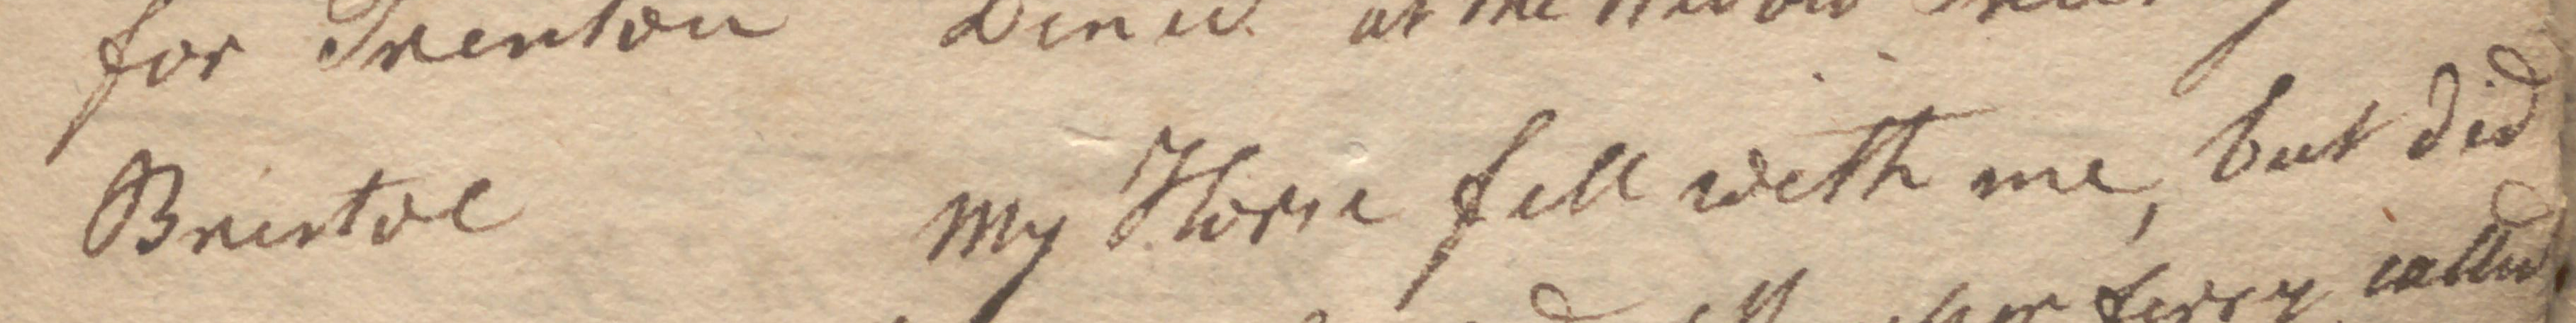Bristol my Horse fell with me but did
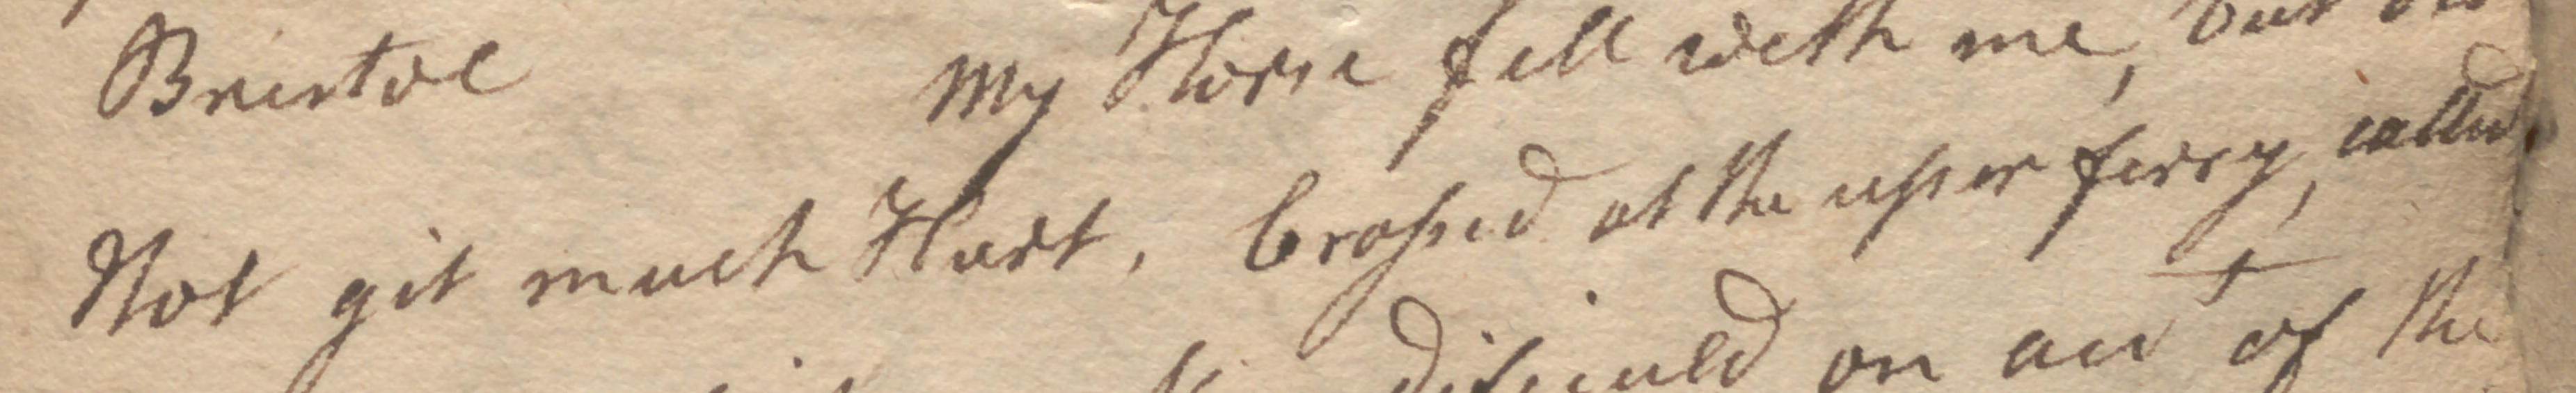Not git much Hurt, Crossed at the uper ferry called
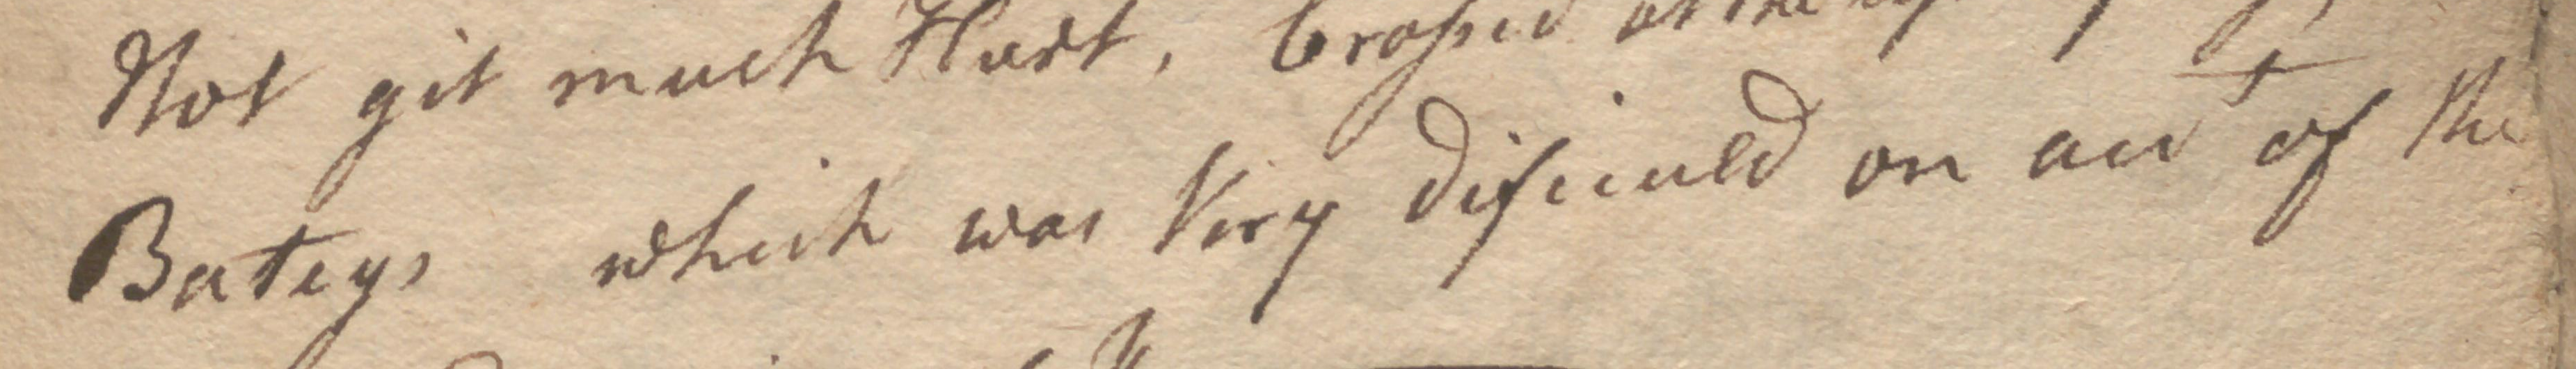Bateys which was Very dificuld on acc^t of the
